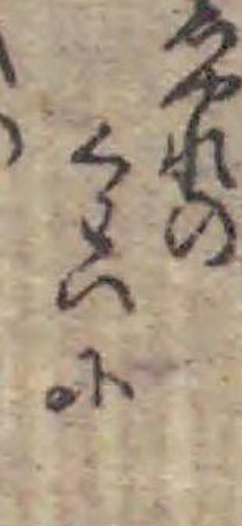くわいに
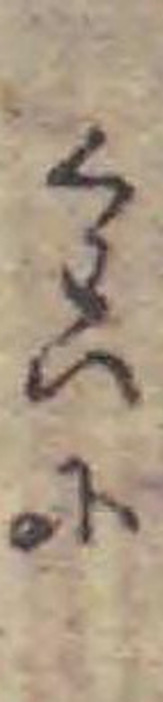くわいに
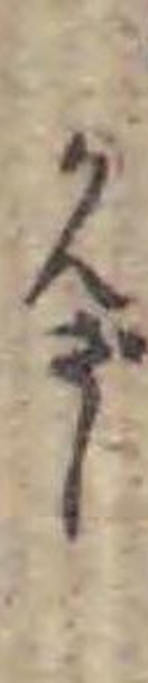かんざし
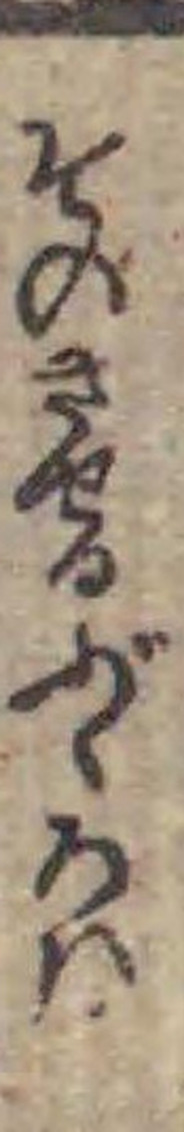そのきせるぶくろは
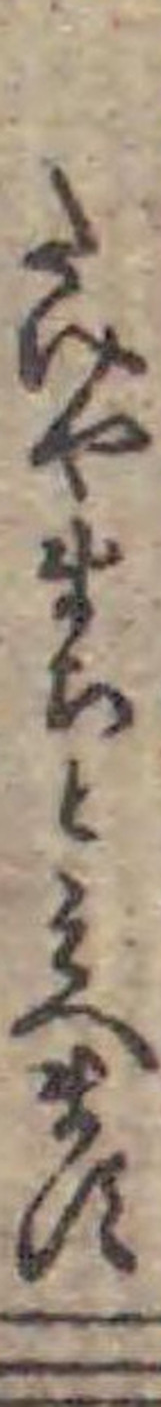たけやまちとみへます
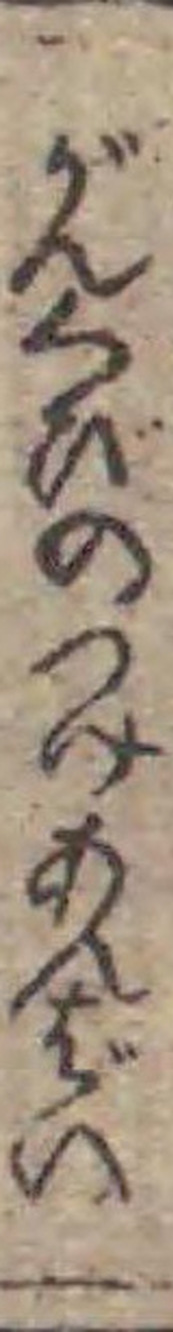がんくびのつけあんばい
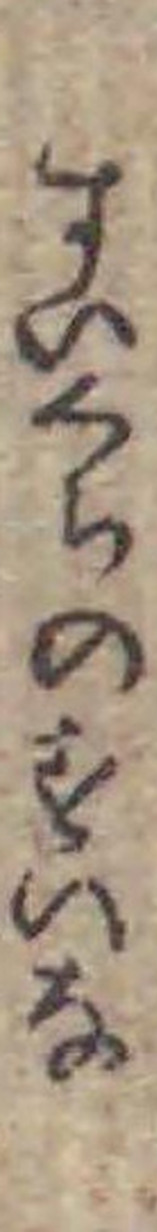すいくちのすいな
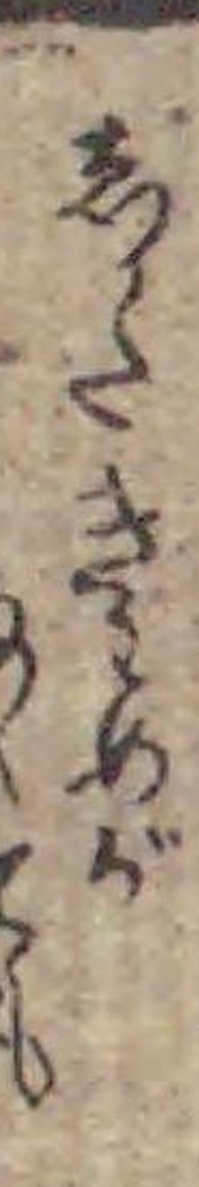しかたきわめが
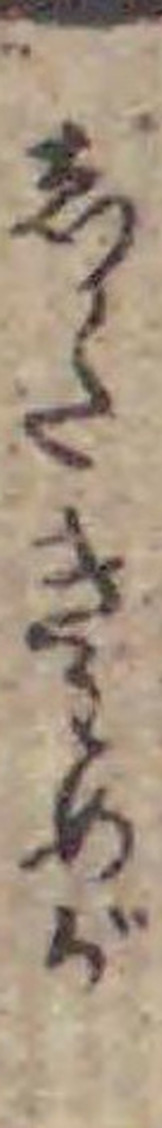しかたきわめが
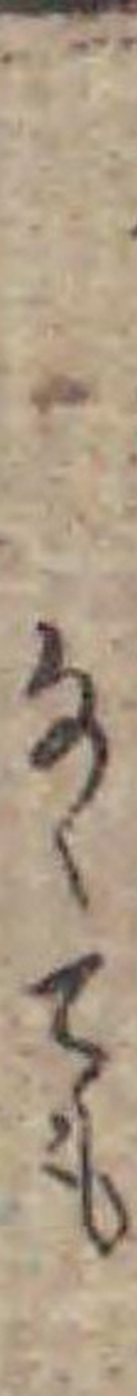なくても
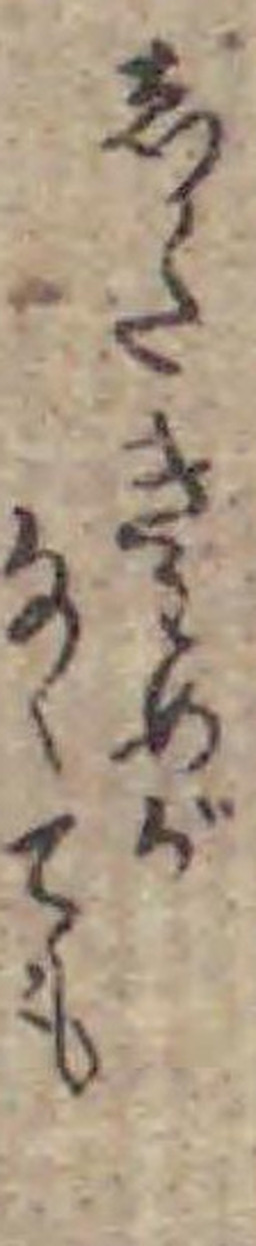なくても
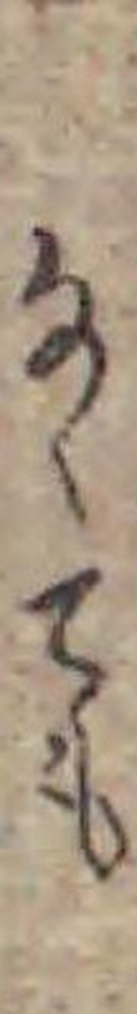なくても
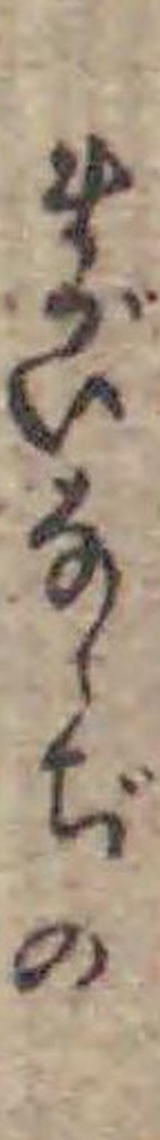まがいなしぢの
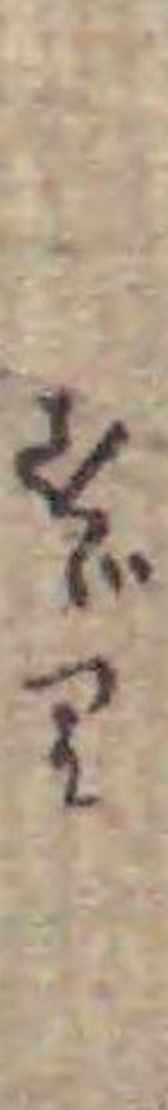すゞり
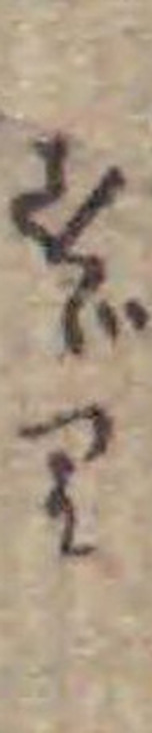すゞり
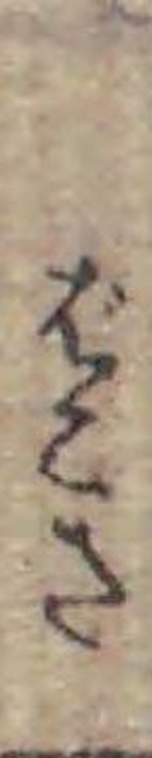ばこた
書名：威気千代牟物語 : 2巻
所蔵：国立国会図書館 National Diet Library, JAPAN
